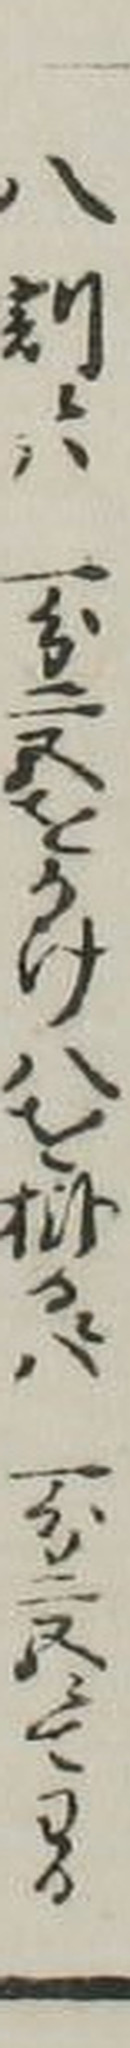八割には一分二五をかけ八を掛るには一分二五にてわる
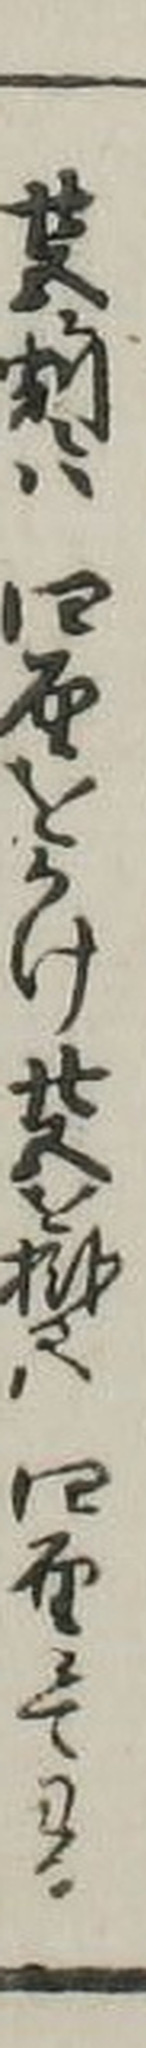二五に割には四厘をかけ廿五を掛るには四厘にてわる
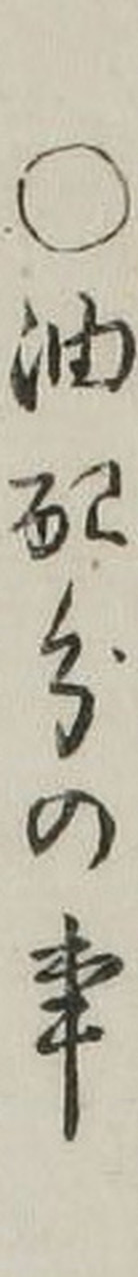○油配分の事
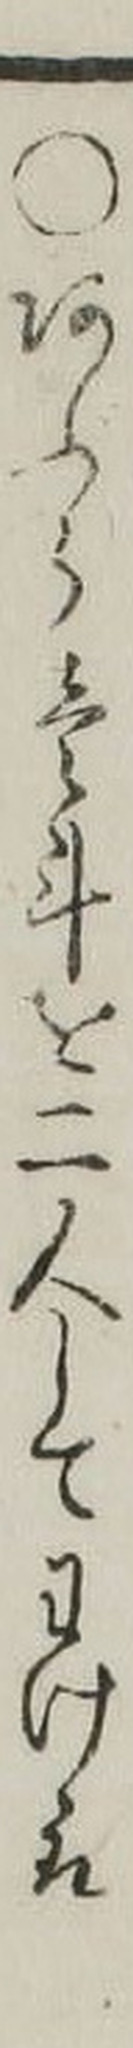○あぶら壱斗を二人してわけ取
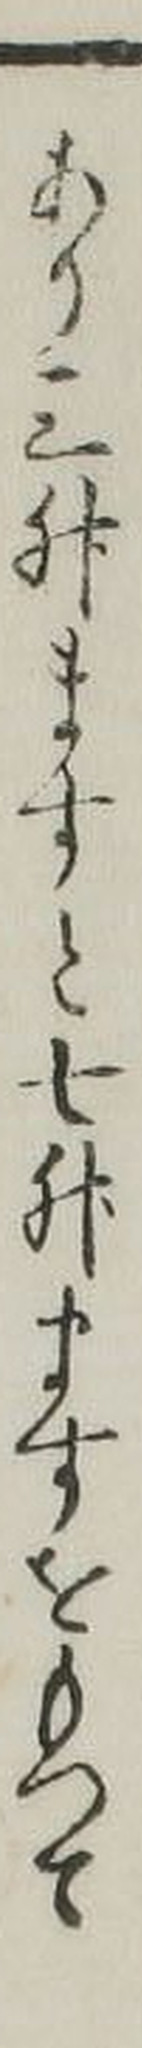あり三升ますと七升ますをもつて
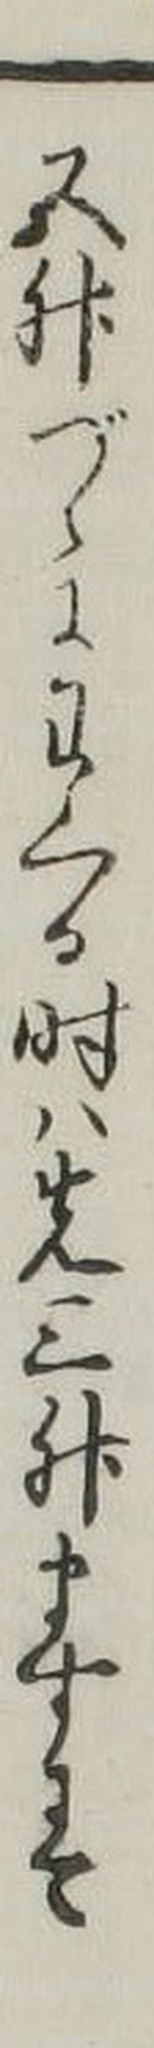五升づゝにわくる時は先三升ますにて
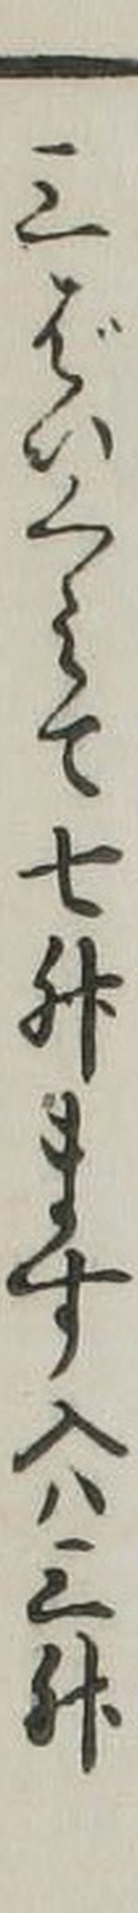三ばいくみて七升ます入は三升
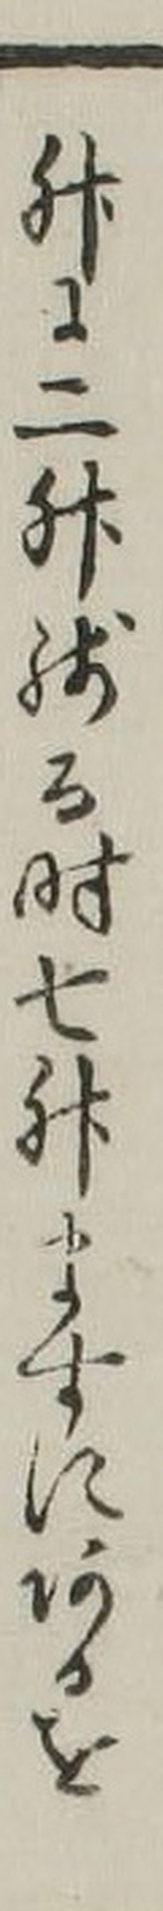升に二升残る時七升ますにあるを
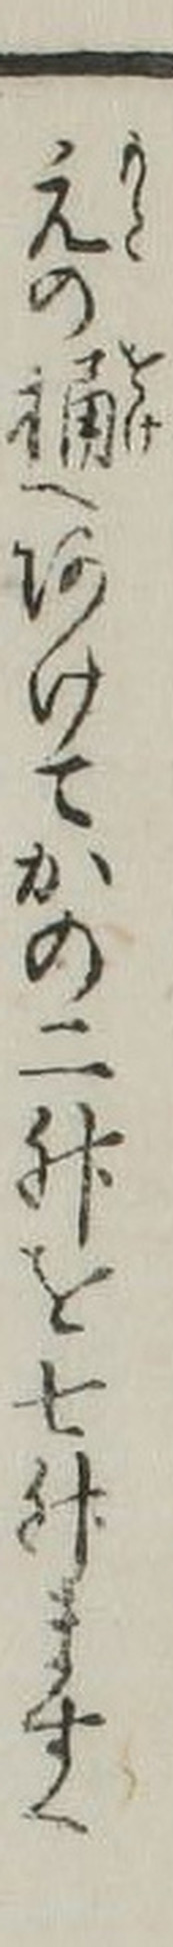元の桶へあけてかの二升を七升ますへ
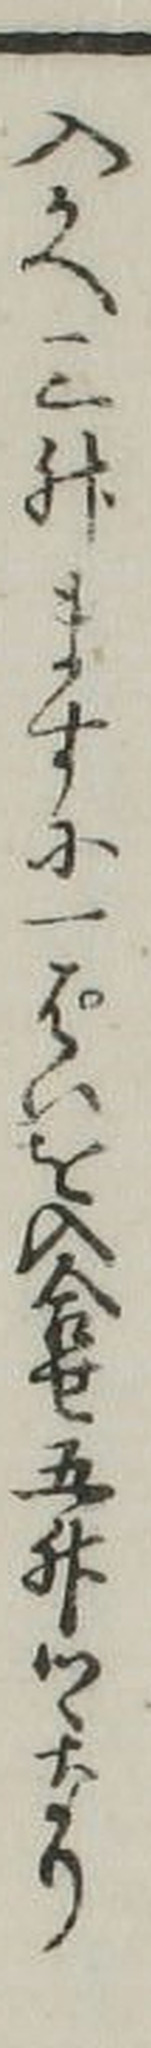入かへ三升ますに一ぱいを入合せ五升つゝなり
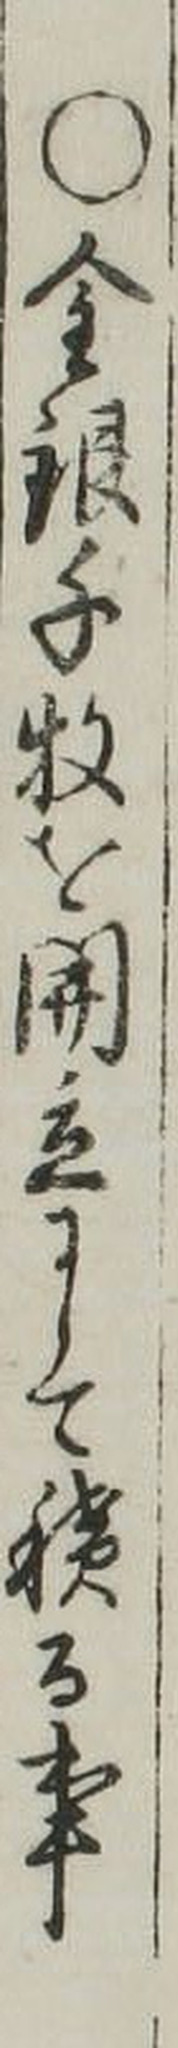○金銀千枚を開立にして積る事
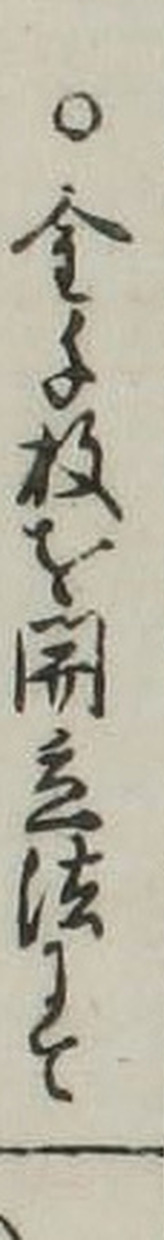○金千枚を開立法にて
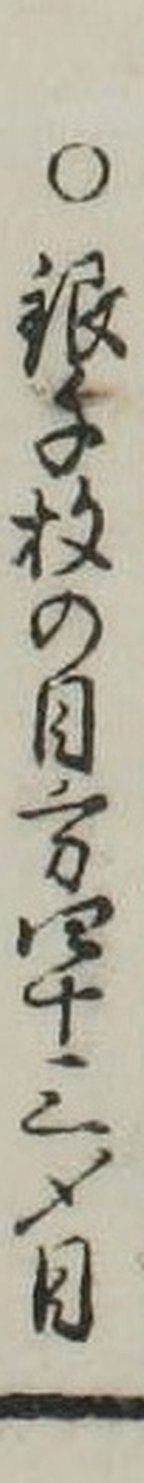○銀千枚の目方四十三貫目
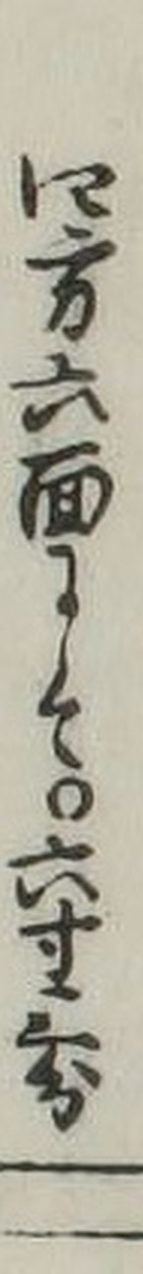四方六面にして〇六三分
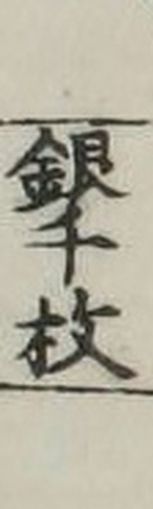銀千枚
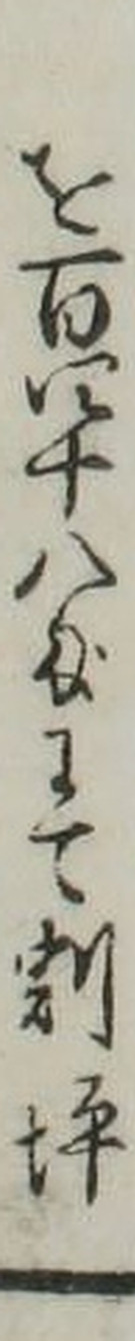を百四十八匁にて割坪
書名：宝玉塵劫記
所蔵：東京学芸大学教育コンテンツアーカイブ
